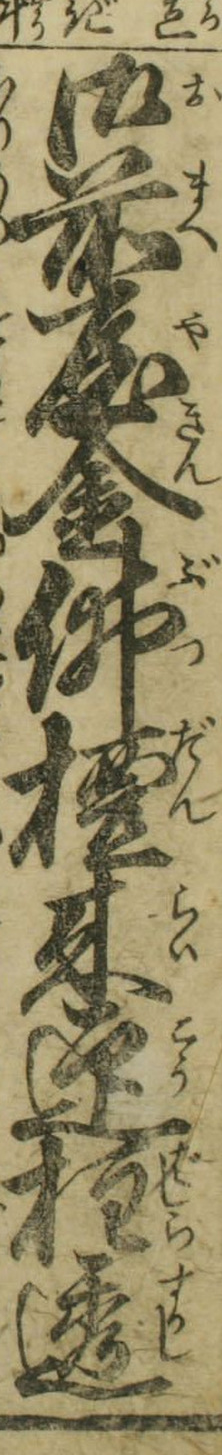御前屋金佛壇来迎柱透
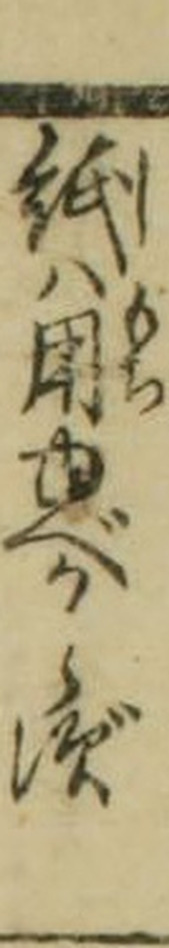紙は用ゆべからず
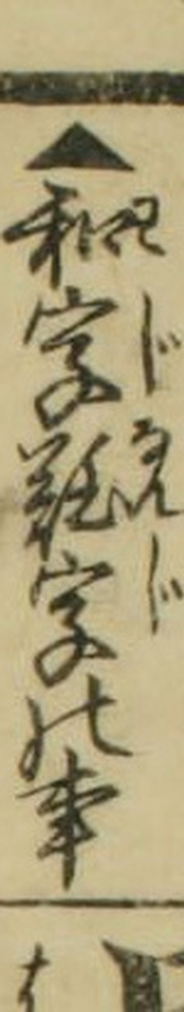▲和字難字の事
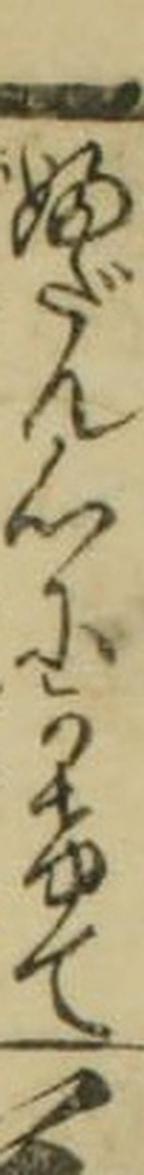ふだん心にかけて
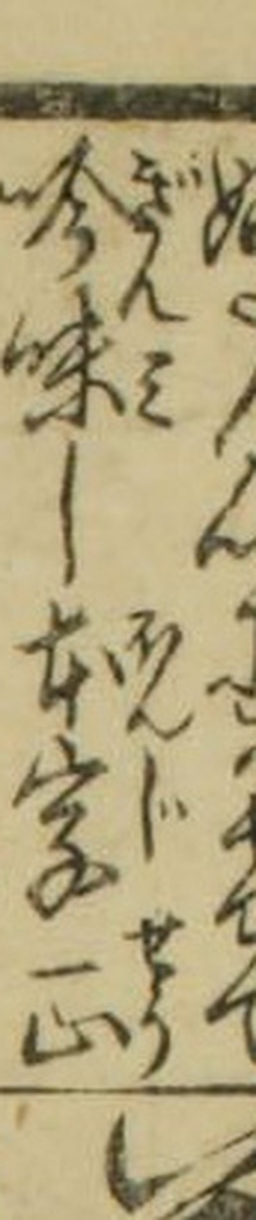吟味し本字正
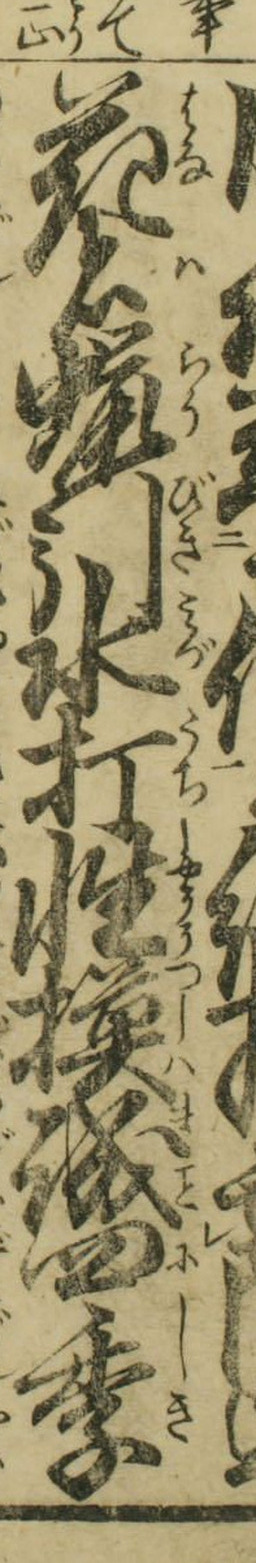花者蝋引水打性摸誠四季
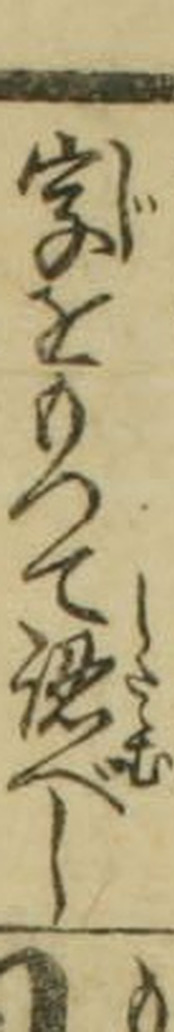字をもつて認べし
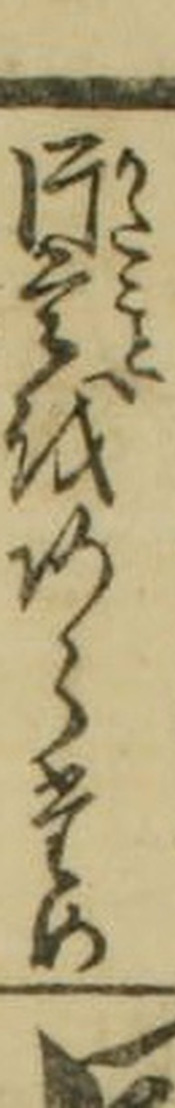片言をあらため
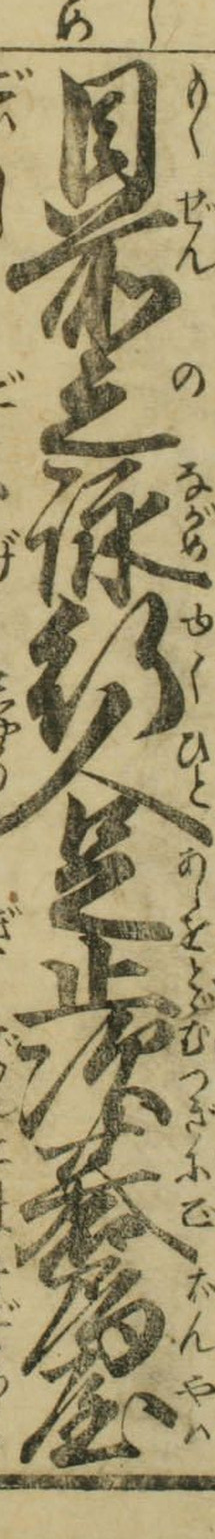目前之詠行人足止次碁局屋
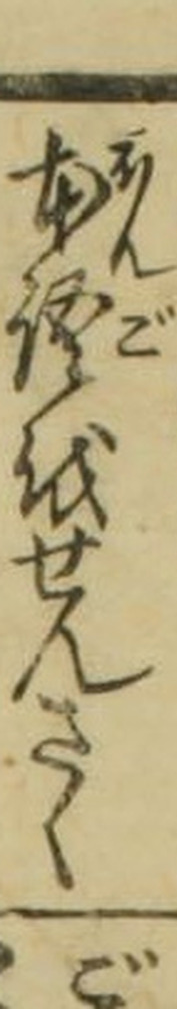本語をせんさく
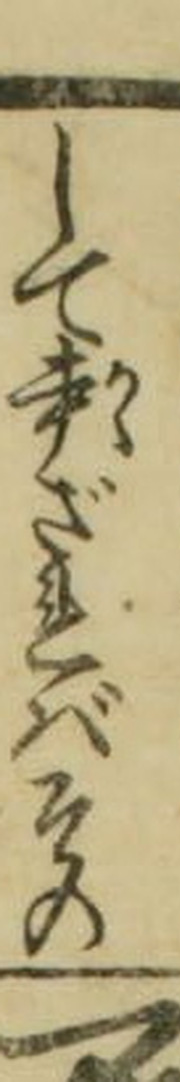して書ざればその
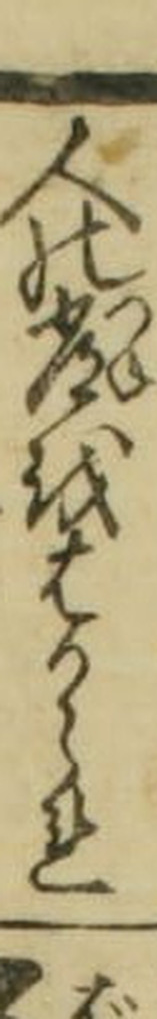人の常をはかられ
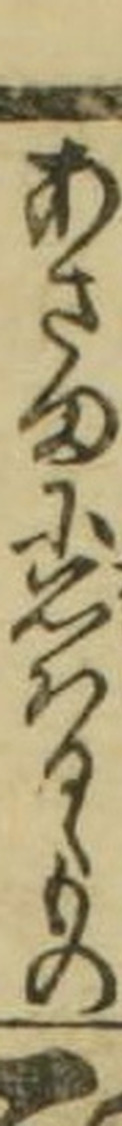あさまに思はるゝもの
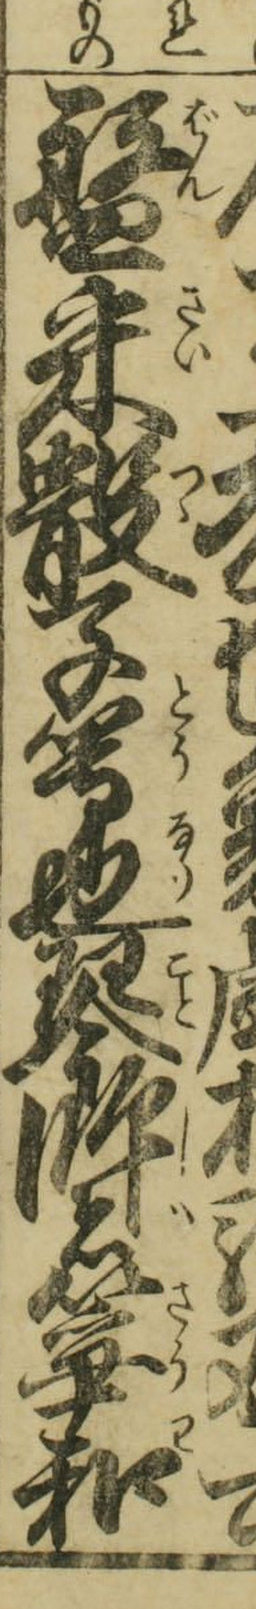盤采骰子等也琴師者筝和
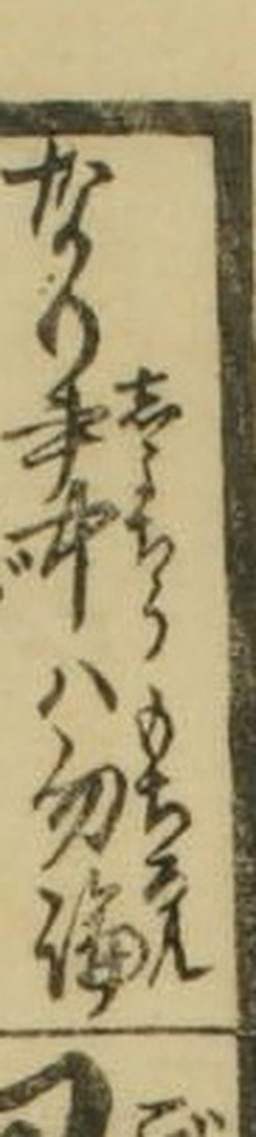なり書中は勿論
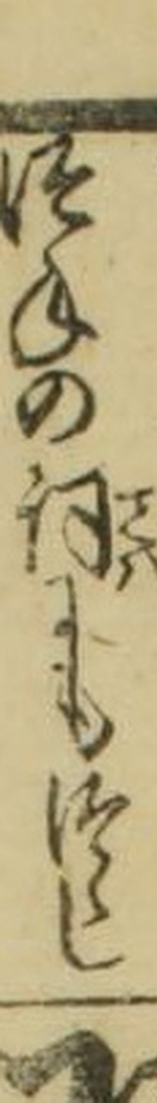つねの詞にもつゝし
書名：増補職人往来
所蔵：東京学芸大学教育コンテンツアーカイブ
